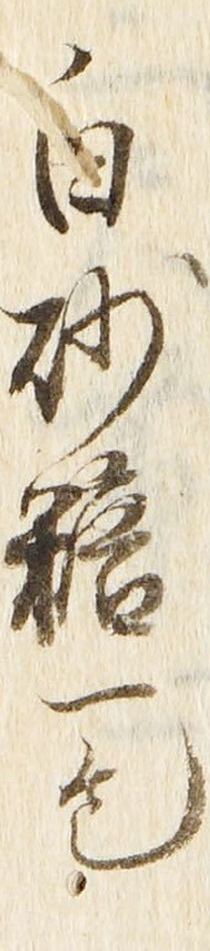白砂糖一包
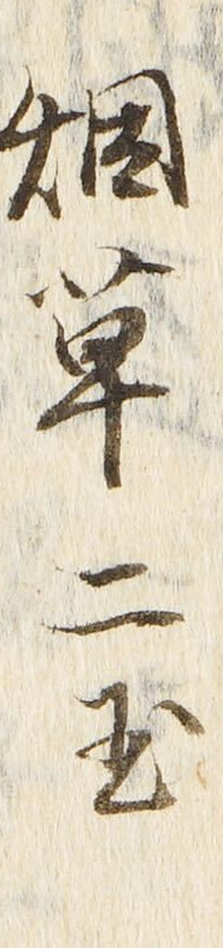烟草二玉
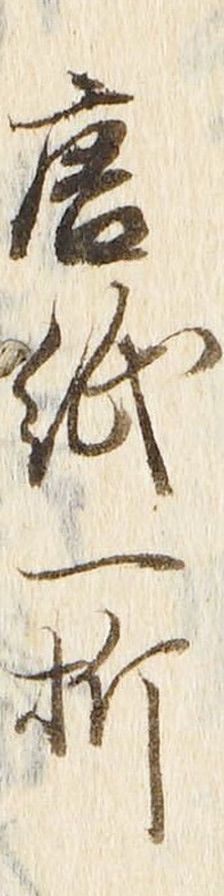唐紙一折
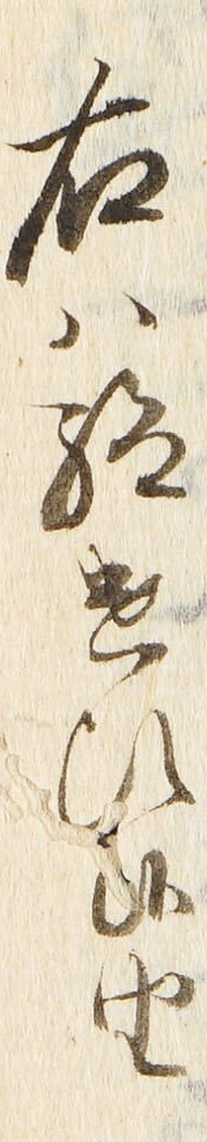右は給遣ひ候由
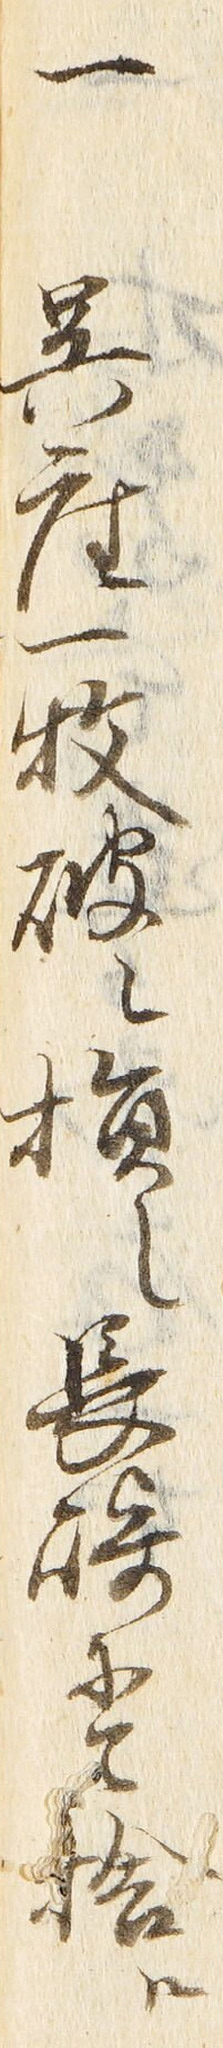一呉座一枚破れ損し長崎にて捨る
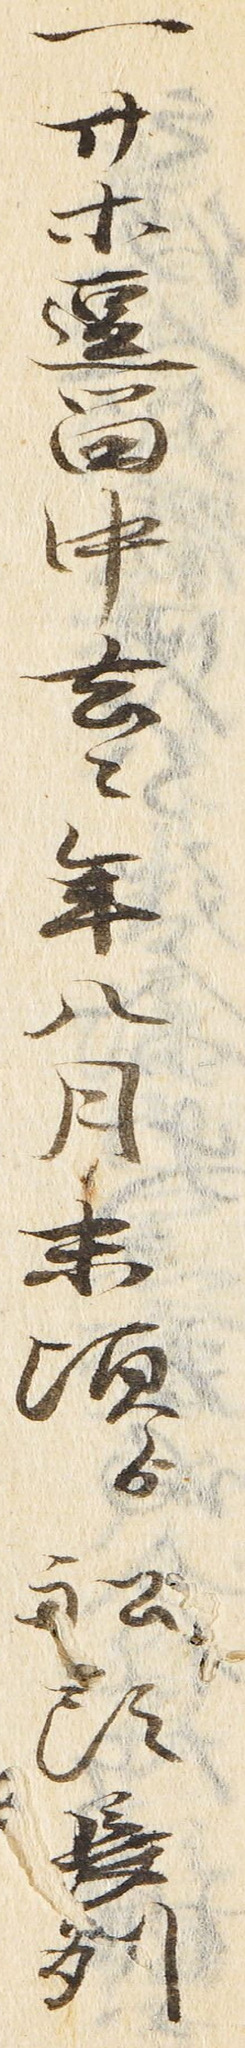一サホ逗留中去々年八月末頃ゟ船頭長州
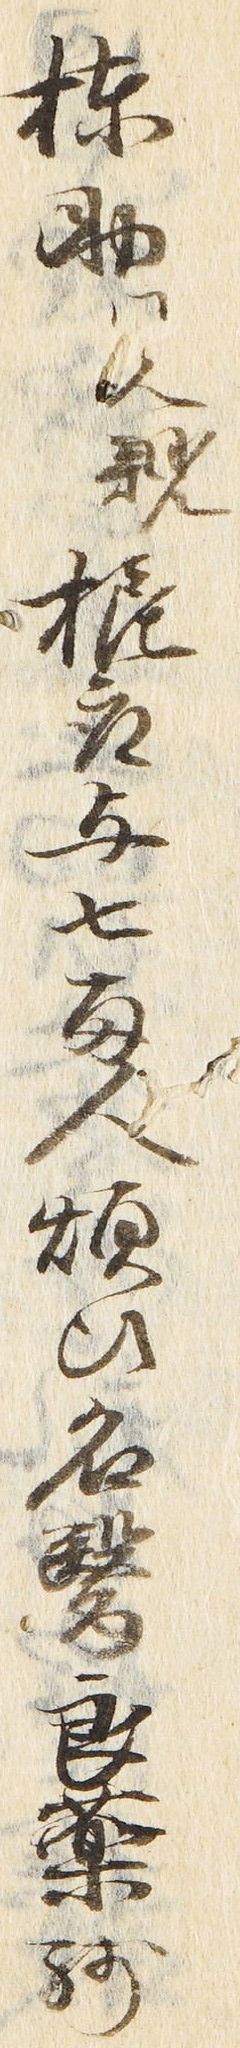棟助同人親梶取与七両人煩ひ名医良薬残
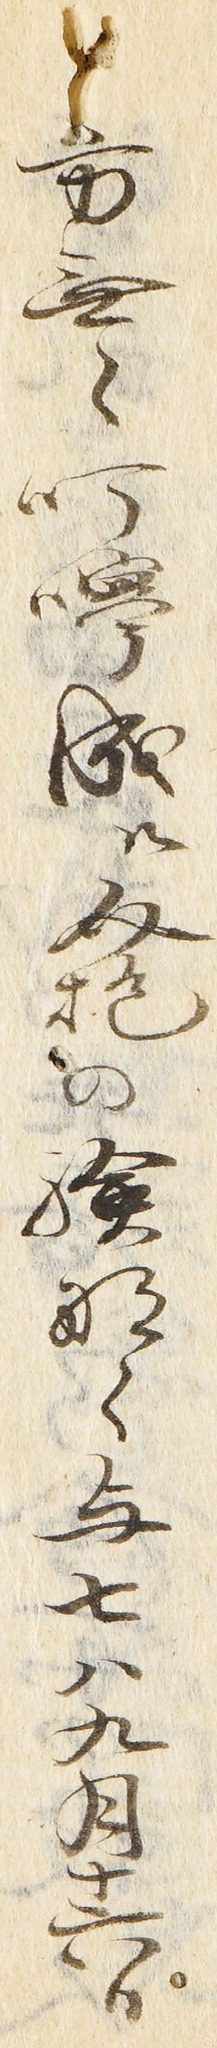方無之叮嚀成る介抱の験なく与七は九月十六日
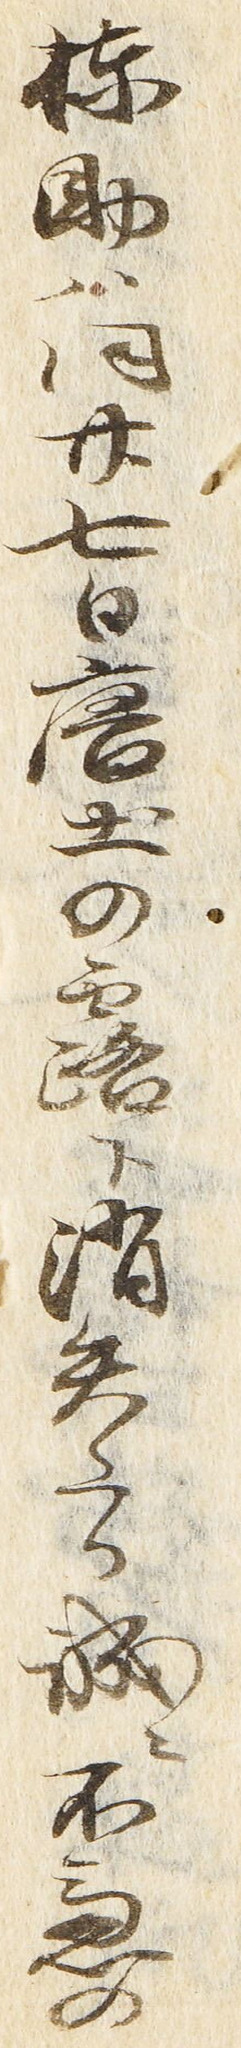椋助は同廿七日唐土の露と消失たり誠に不慮の
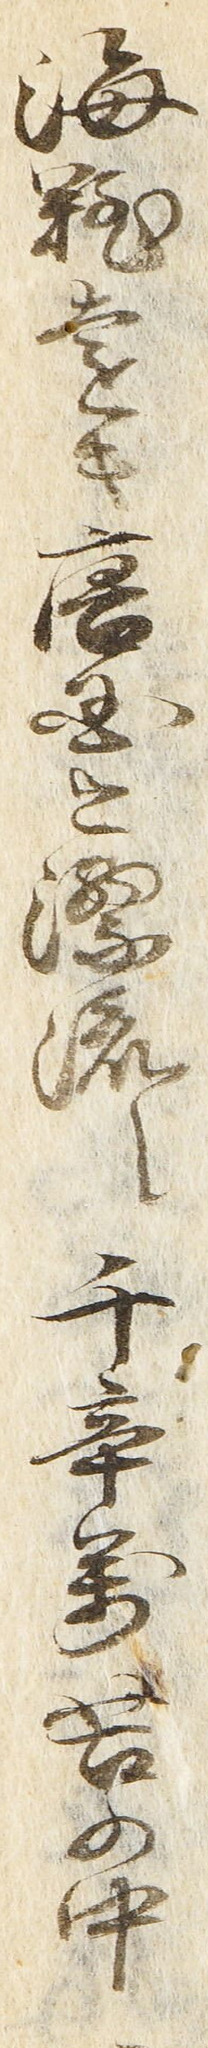海難遠き唐国迄漂流し千辛万苦に中に
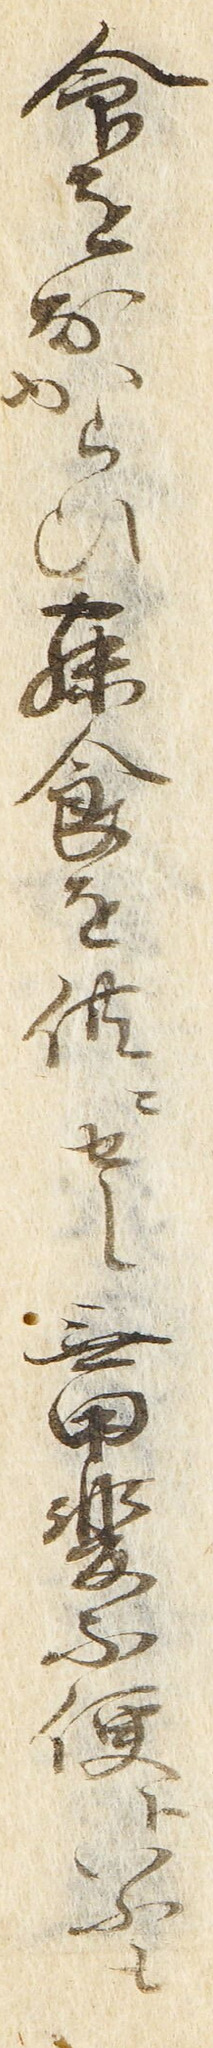命をなからひ寝食を供にせし無甲斐不便といふも

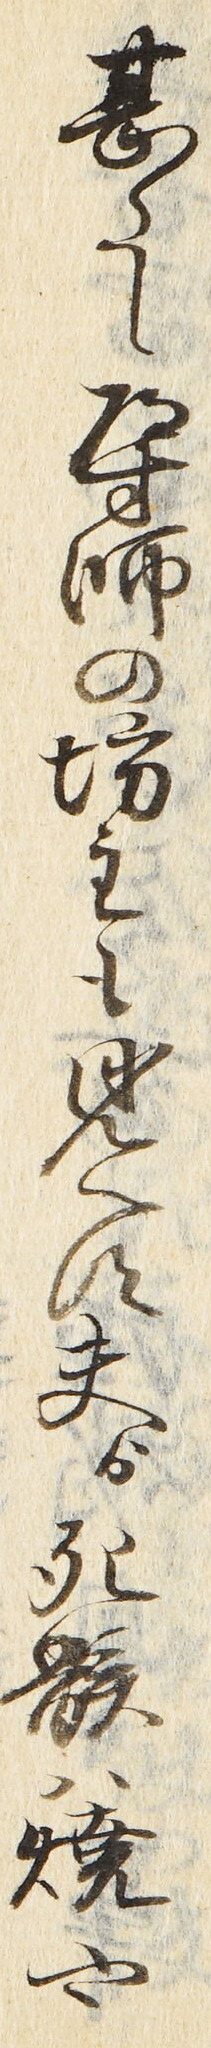甚たし導師の坊主も見へす夫ゟ死骸は焼や
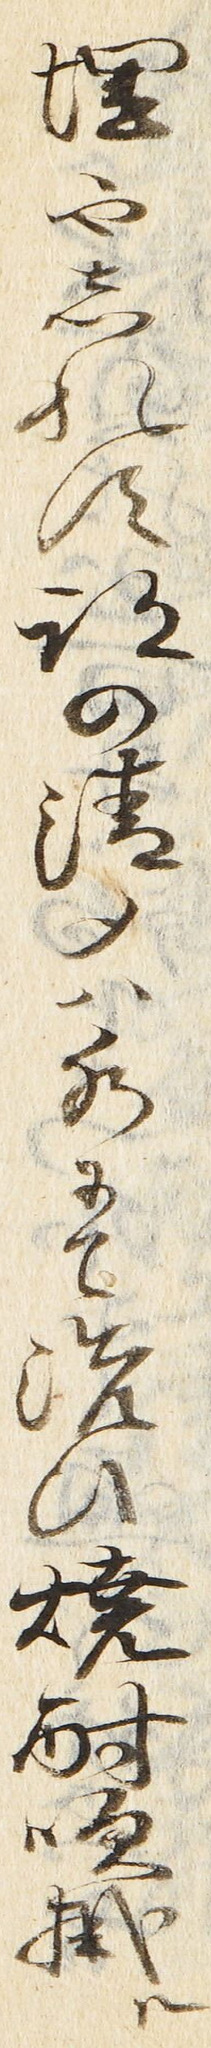埋やしれす跡の清メは水にて洗ひ焼酎吹掛る
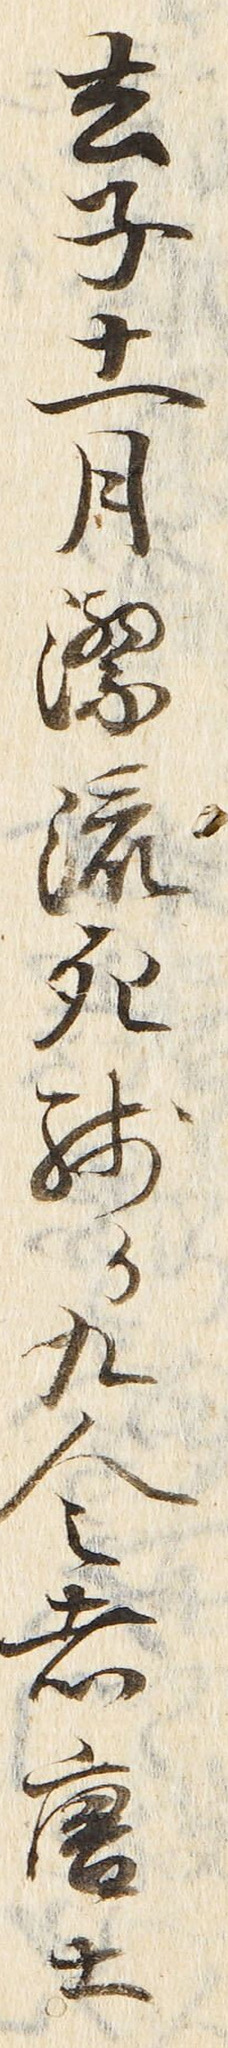去子十一月漂流死残り九人之者唐土
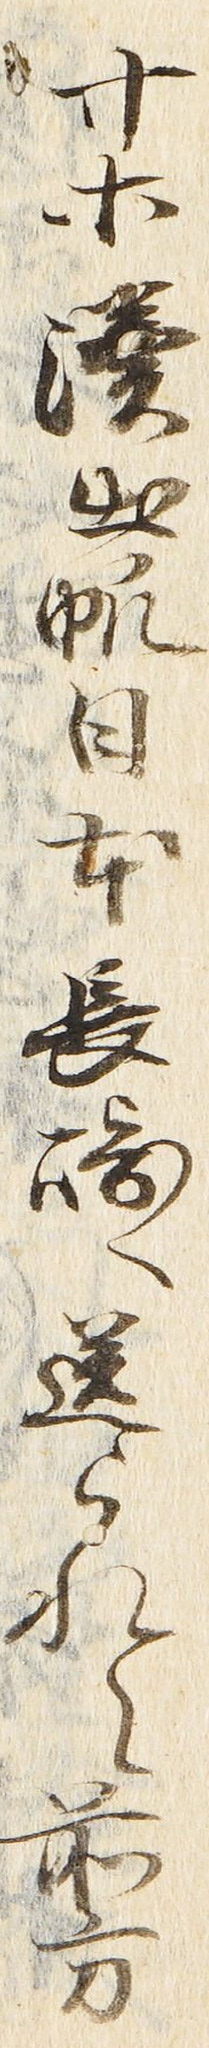サホ湾出帆日本長崎へ送られし前方
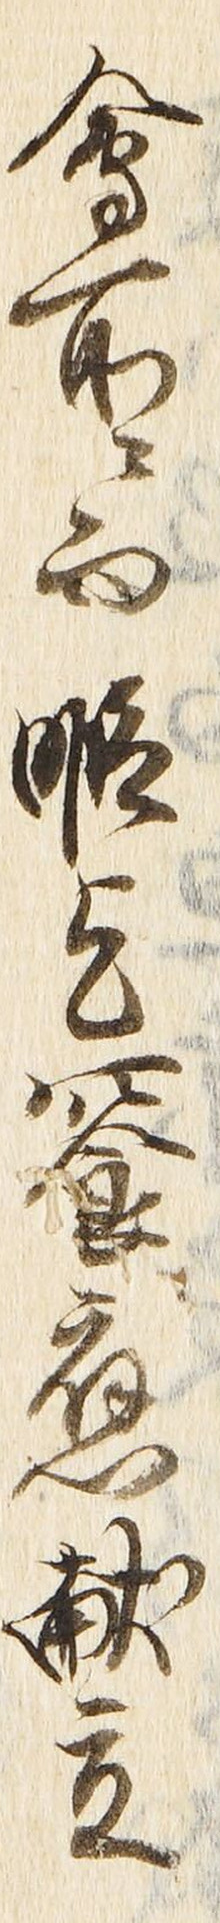会所に而暇乞饗応献立
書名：唐物語
